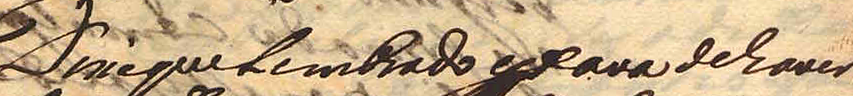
Disse que Lembrado estava de haver
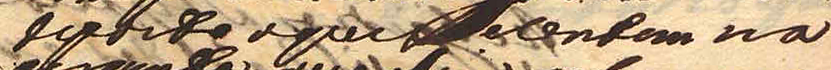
deposto o que se contem na
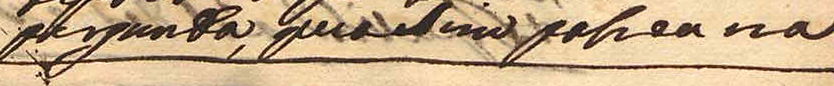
pergunta, que asim passou na
